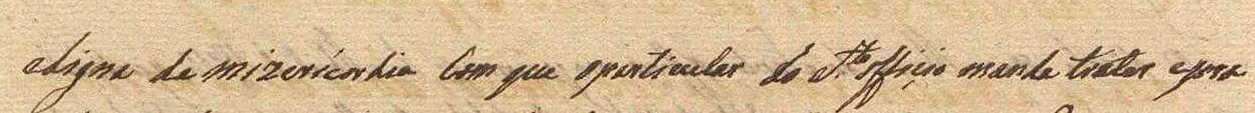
e digna da mizericordia Com que o particular do S.to officio mande tratar e pro
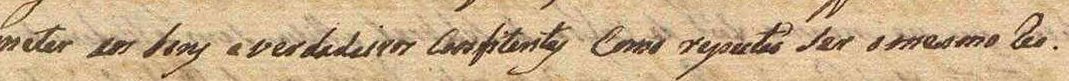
meter aos bons o verdadeiros Confitentes Como reputaõ ser o mesmo Reo.
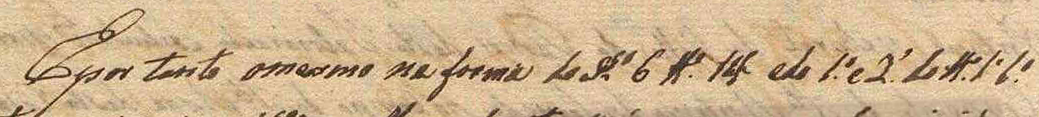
E portanto o mesmo na forma do S.º 6 tt.o 14 e do 1.o e 2.o do tt.o 1.º 6.º
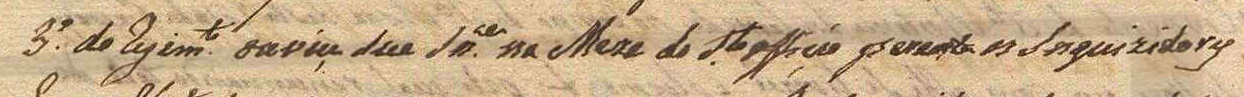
3.º do Regim.to ouvice sua sn.ca na Meza do S.to officio perante os Inquizidores
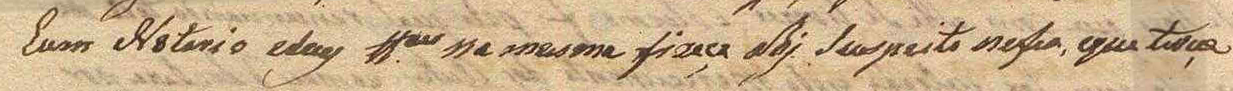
hum Notario e duas tt.as na mesma fizeca ahj suspeito nessa, que tevece
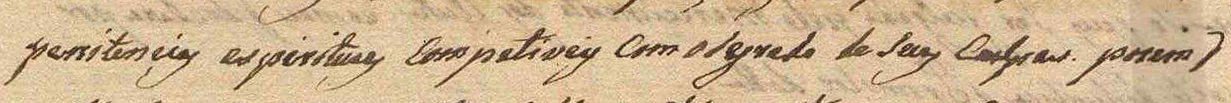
penitencias espirituaes compativeis com o segredo de suas Culpas. porem q̄
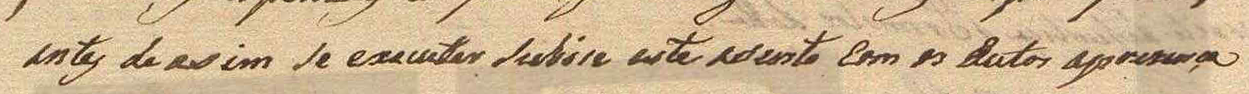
antes de asim se executar subise este asento com os Autos a prezença
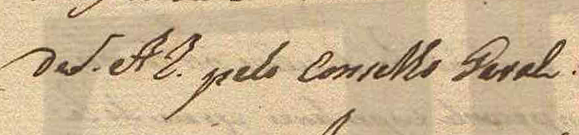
de S. A R. pelo conselho geral.
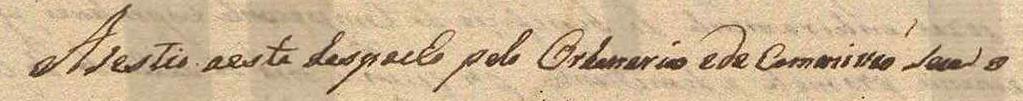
Asestio a este despacho pelo Ordinario e de Commisaõ sua o
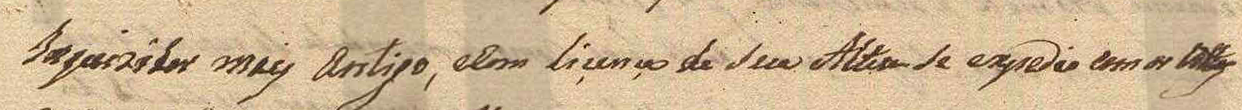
Inquizidor mais antigo, e com Licença de sua Altesa se expedio com os Auttos
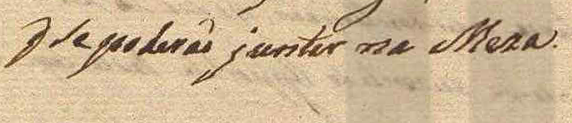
q̄ se poderaõ juntar na Meza.
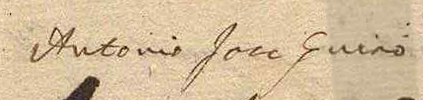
Antonio Joze Guiaõ
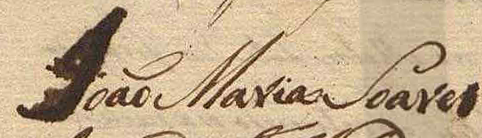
Ioaõ Maria Soares
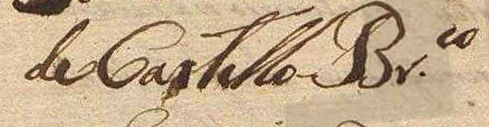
de Castello Br.co
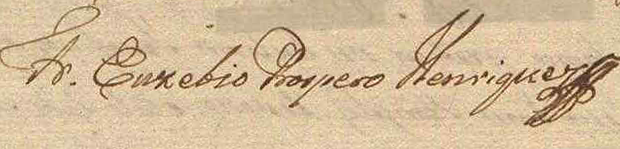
Fr. Eusebio Prospero Henriques
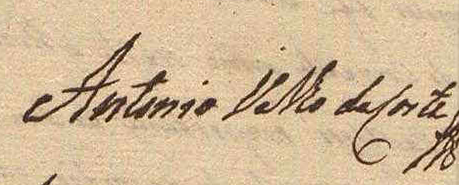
Antonio Velho da Costa
